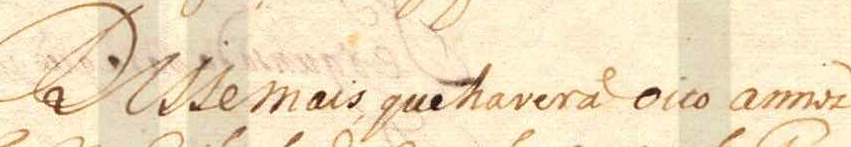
Disse mais, que haverá oito annoz
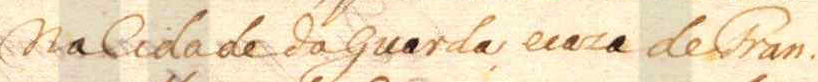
na Cidade da Guarda, e caza de Fran
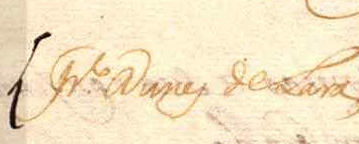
L Fr.co Nunes de Lara
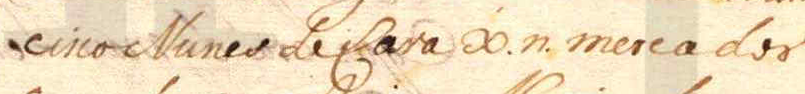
cisco Nunes de Lara x. n. mercador
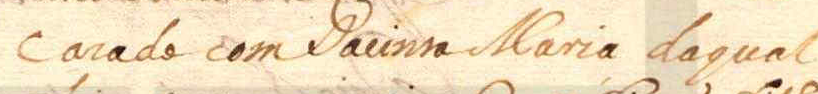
cazado com Iacinta Maria da qual
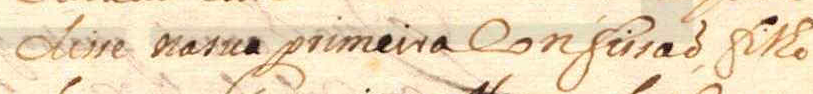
disse na sua primeira Confissaõ, filho
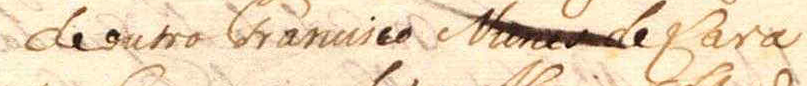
de outro Francisco Nunes de Lara
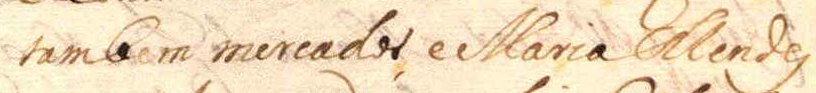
tambem mercador, e Maria Mendes
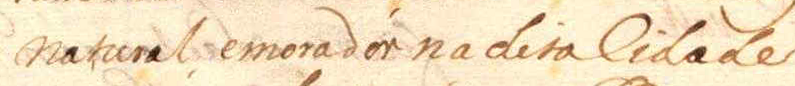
natural, e morador na dita Cidade
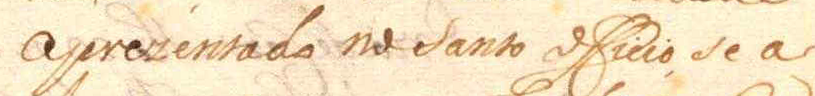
aprezentado no Santo officio, se a
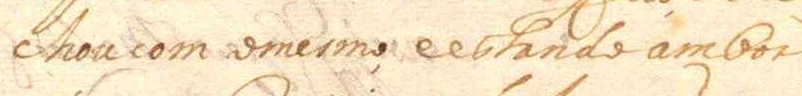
chou com o mesmo, e estando ambos
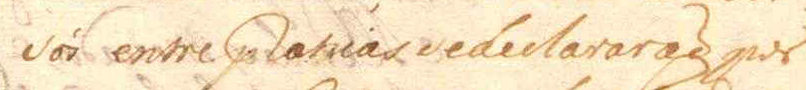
sós entre pRaticas se declararaõ por
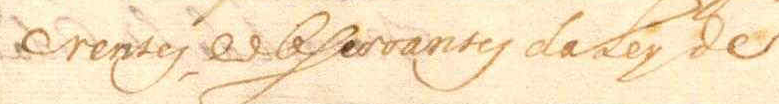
crentes, e observantes da Ley de
